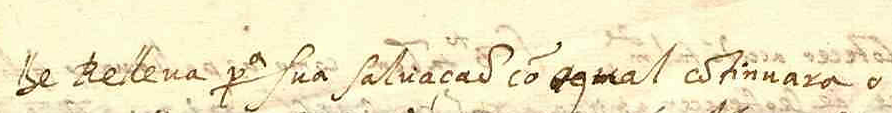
lhe Relleua ꝑa sua saluação cō o qual cōtinuara o
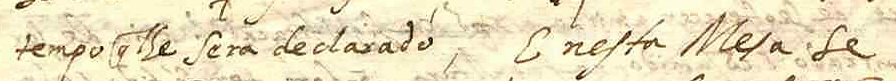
tempo q̄ lhe sera declarado, E nesta Mesa se
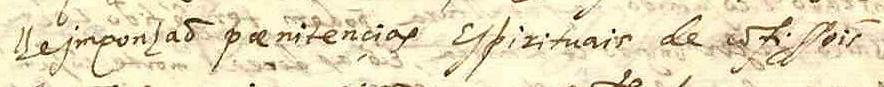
lhe jmponhaõ pœnitencias Espirituais de cōfissoĩs
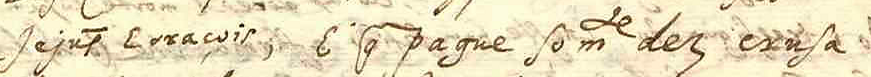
Jejūs E oraçois, E q̄ pague somte dez crusa
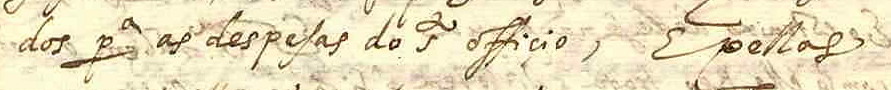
dos ꝑa as despesas do sto officio, E pellas
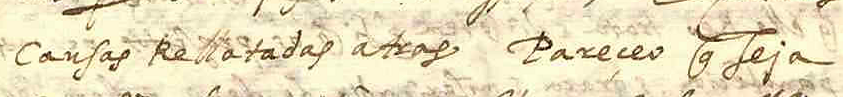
causas Rellatadas atras Pareceo q̄ seja
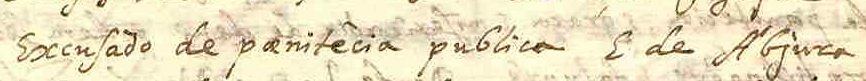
Excusado de pænitēcia publica E de Abjura
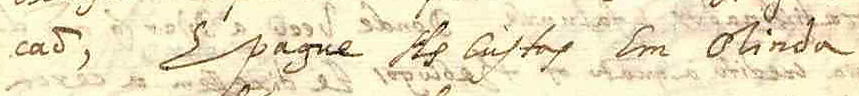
çaõ, E pague As custas Em Olinda
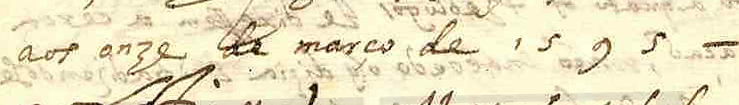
aos onze de março de 1595 -
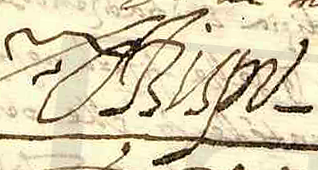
O Bispo
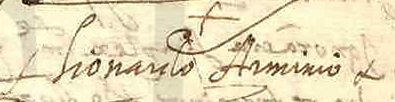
lionardo Arminio
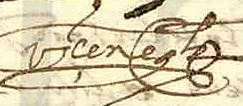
Vicente glz̄
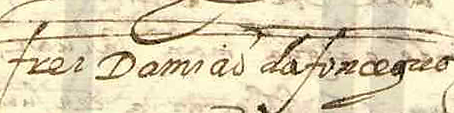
frei Damiaõ dafoncequa
